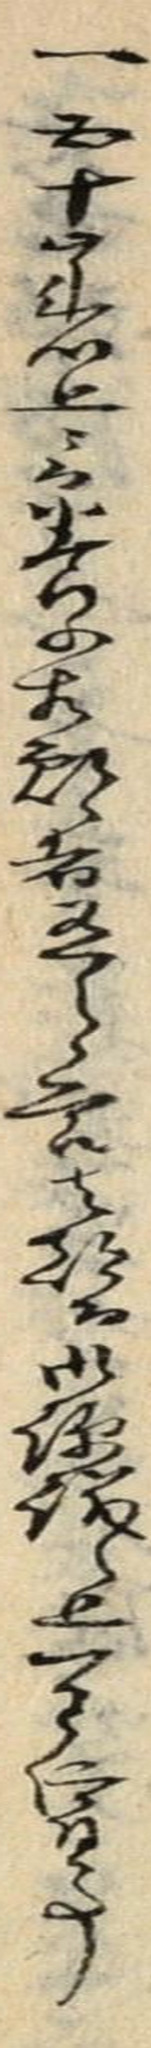一五十歳以上ニ而養子相願候者有之候節者都而御評議之上可被仰付事
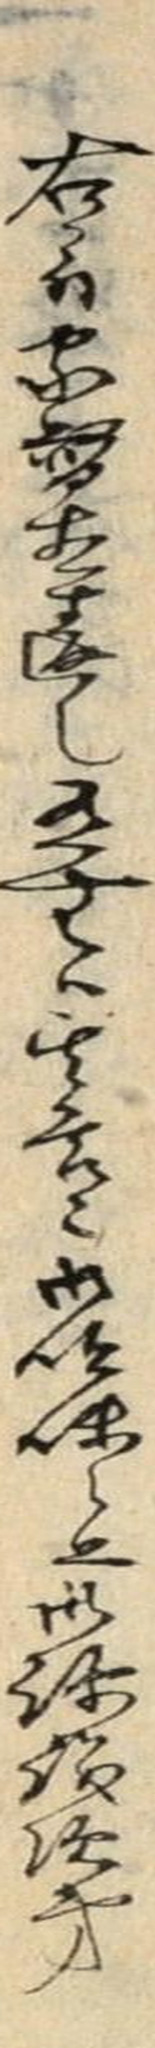右ニ付家督相違之有無ハ其節ニ御吟味之上御評議次第
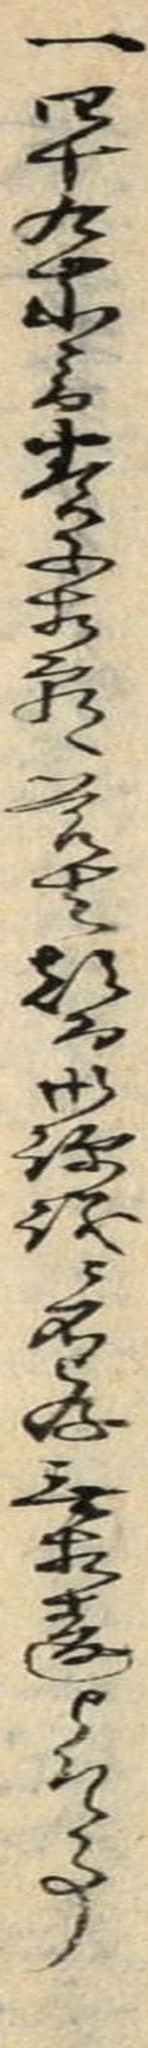一四十九歳ニ而養子相願候節者都而御評議ニ不被及無相違被下候事
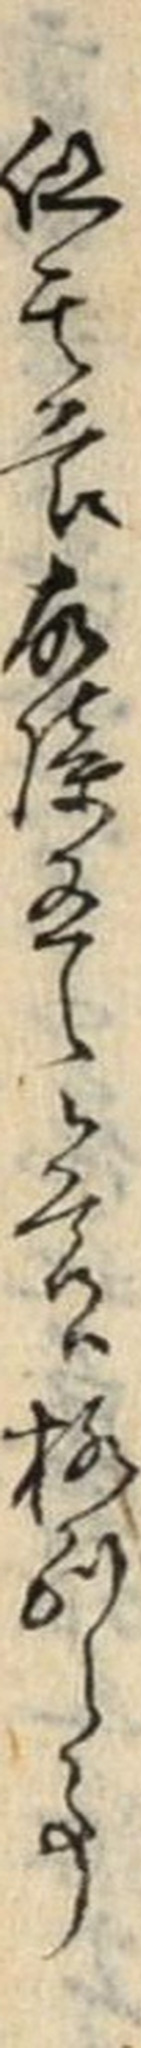但其節故障有之候節は格別之事
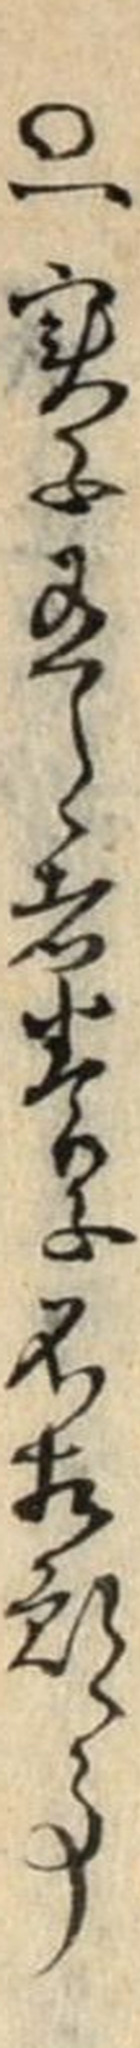〇一実子有之候者養子不相願候事
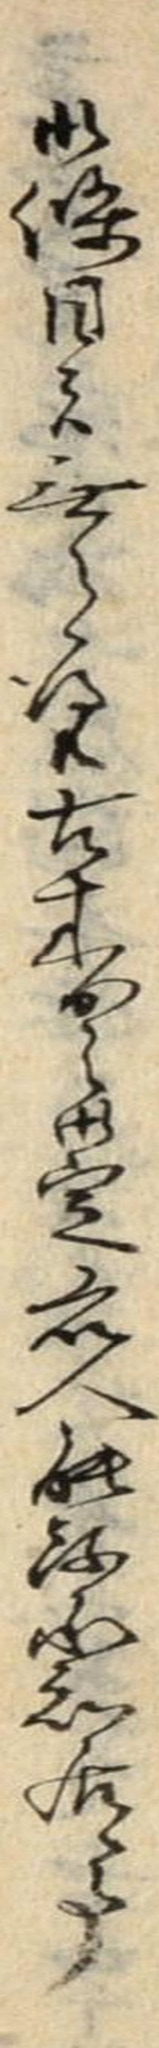御条目ニハ無之候得共古来ゟ之御定衆人能致承知居候事

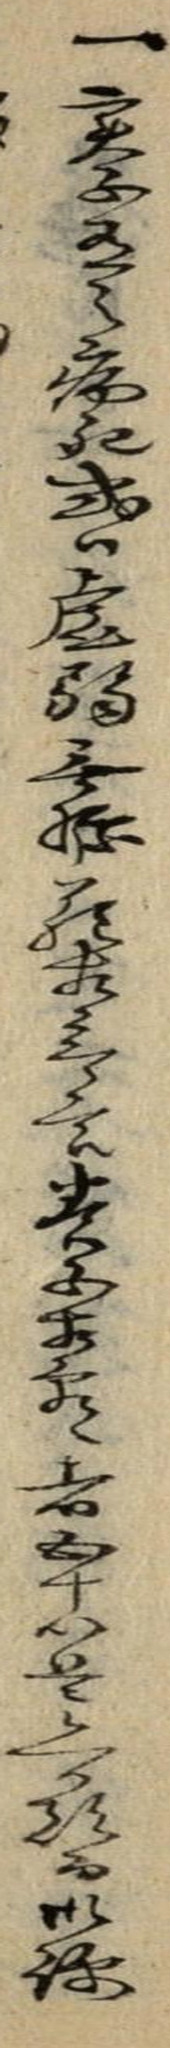一実子有之候病死或ハ虚弱無拠難相立候節養子相願候者五十以上ニ候へハ都而御評
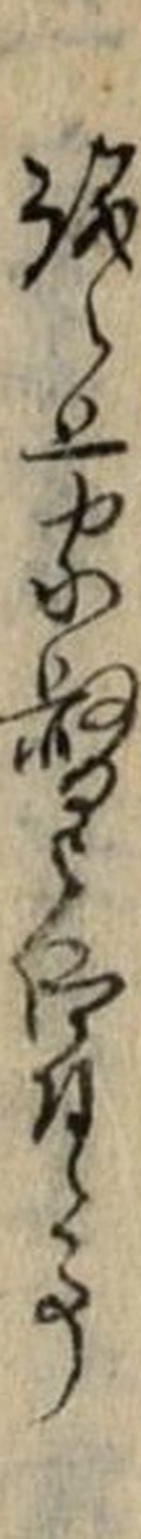議之上家督被仰付候事
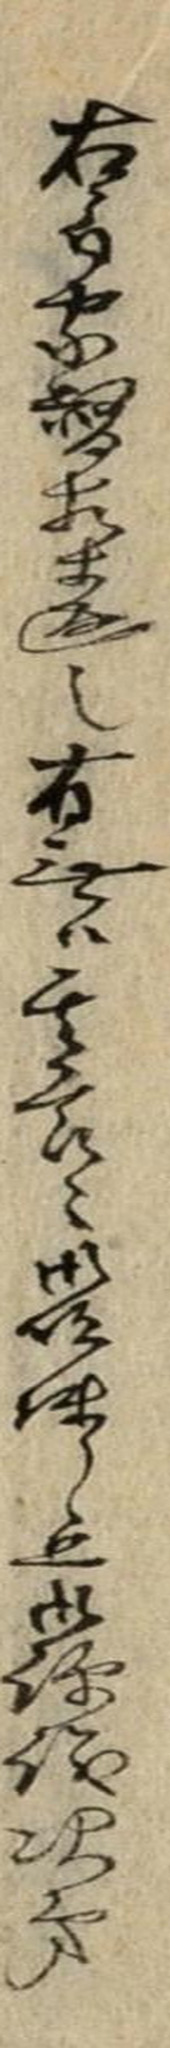右ニ付家督相違之有無ハ其節ニ御吟味之上御評議次第
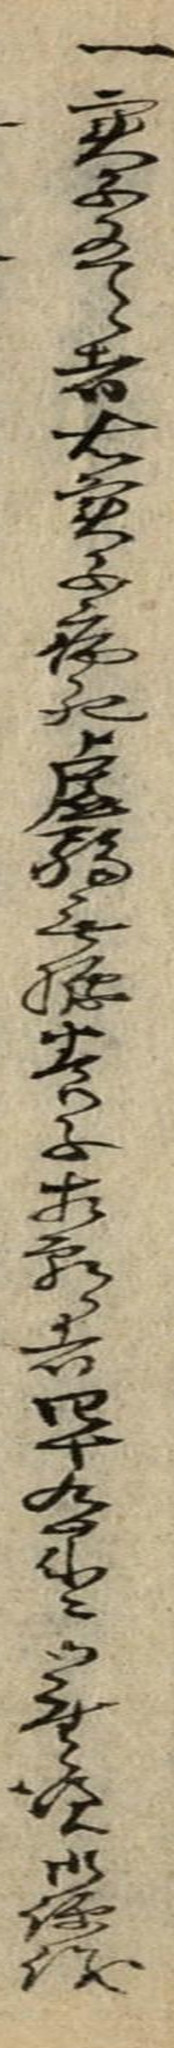一実子有之者右実子病死虚弱無拠養子相願候者四十九歳ニ御座候得ハ御評議
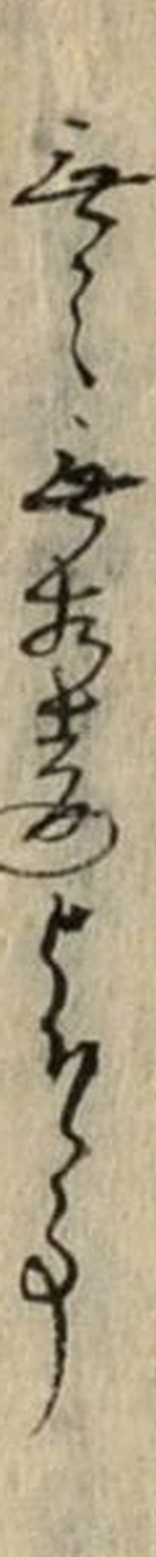無之無相違被下候事
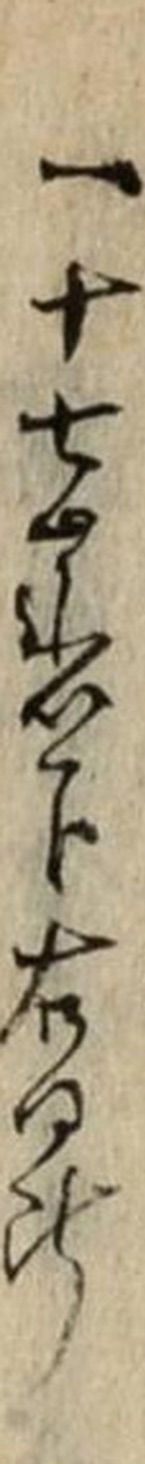一十七歳以下右同断
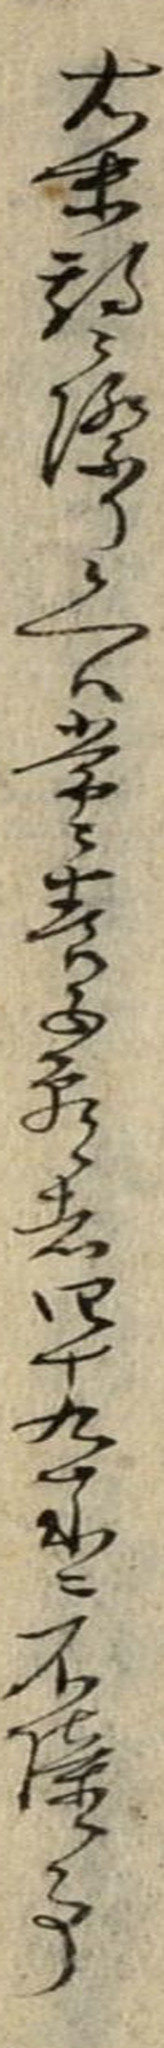右末期ニ際リ候ヘハ常々養子願候者四十九歳ニ不障候事
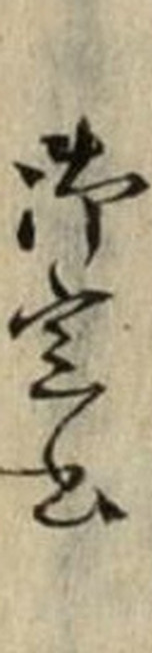御定書
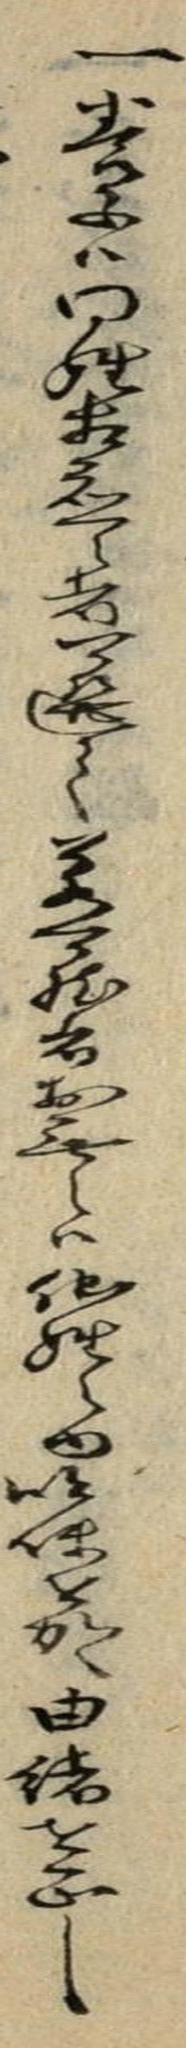一養子ハ同姓相応之者可選之若可然者於無之ハ他姓之内吟味を加ヘ由緒を正し
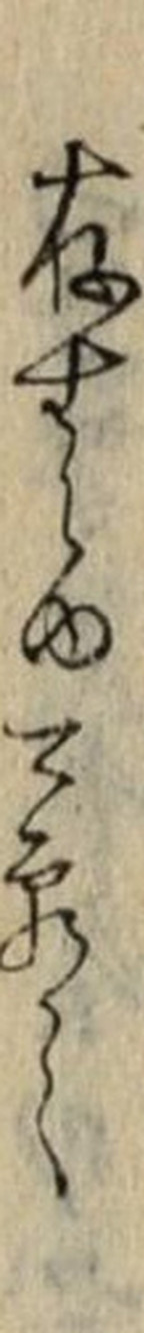存生之内可願之
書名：養子縁組之部
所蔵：福井県文書館 Fukui Prefectural Archives
